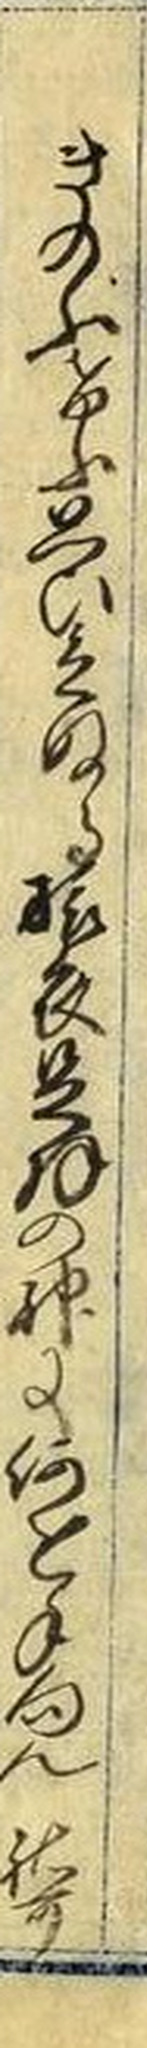きのふけふ思ひ立ぬる旅衣足羽の神に何を手向ん祐可
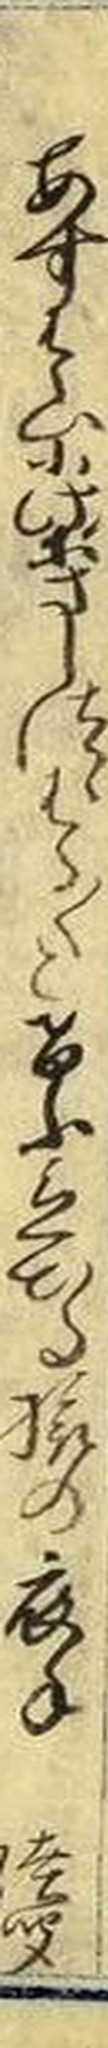あすは山小柴さしつゝはる〳〵とけふ立出る旅の衣手陸叟
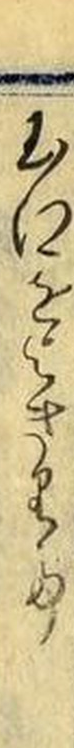玉江をよきりて
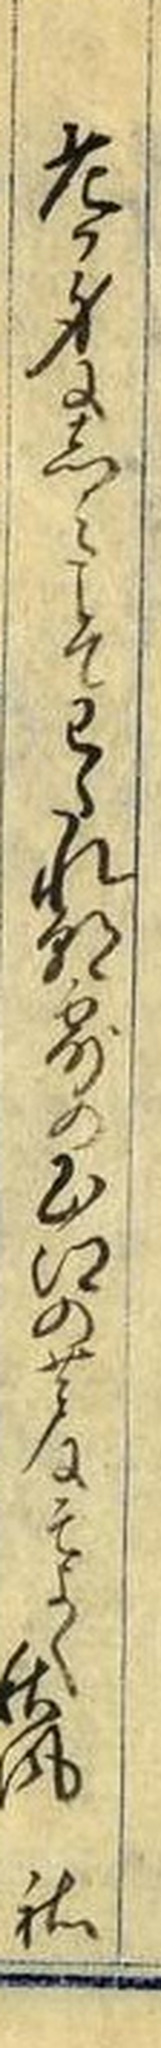老か身にしるしてわたれ朝露の玉江の芦にそよく秋風祐
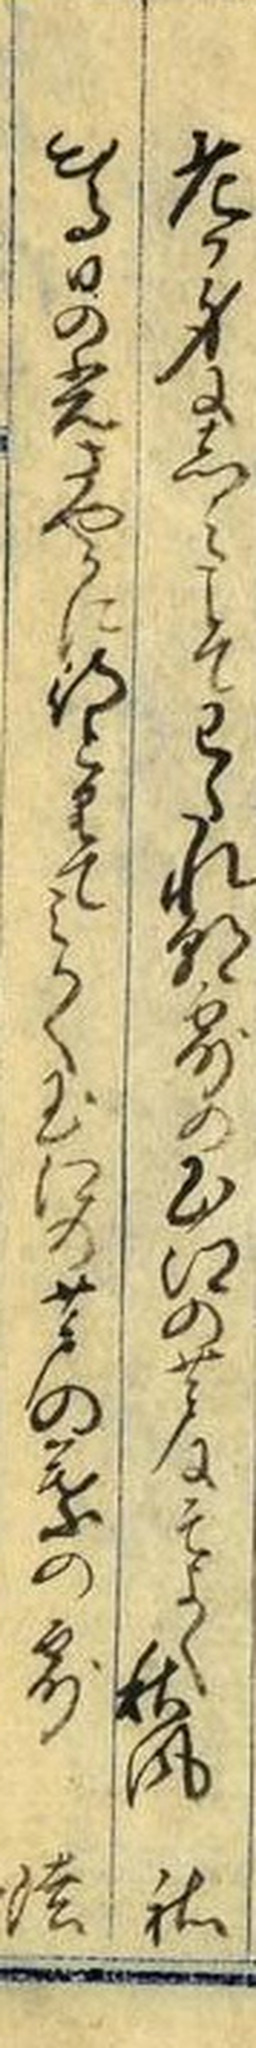出る日の光さやかに待とりてみかく玉江の芦の葉の露陸

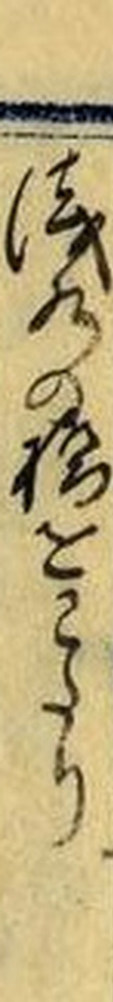浅水の橋をわたり
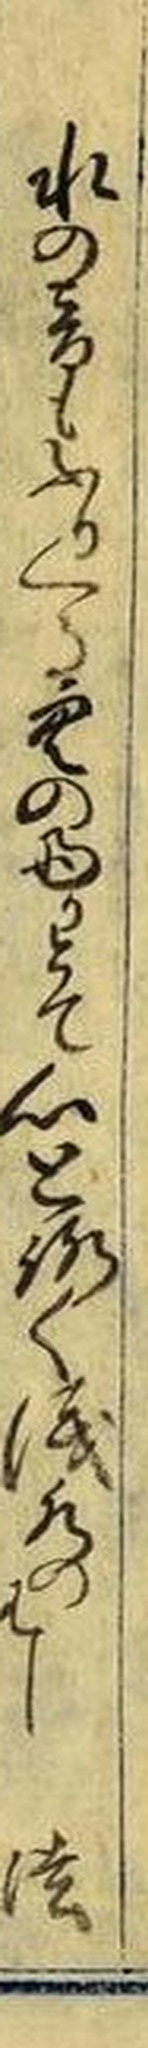水の音もふりくる空のへ雨りとて心とろ〳〵浅水のはし陸
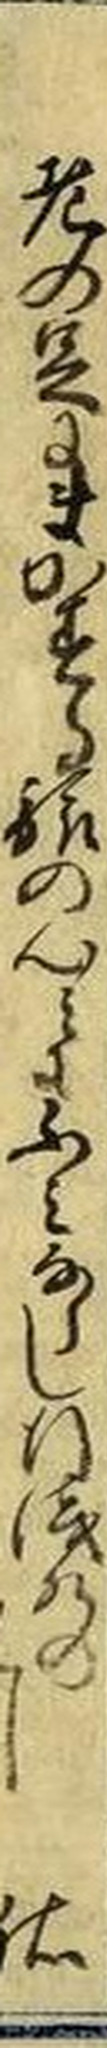老の足にまかする旅の心みにふみならし行浅水のはし祐
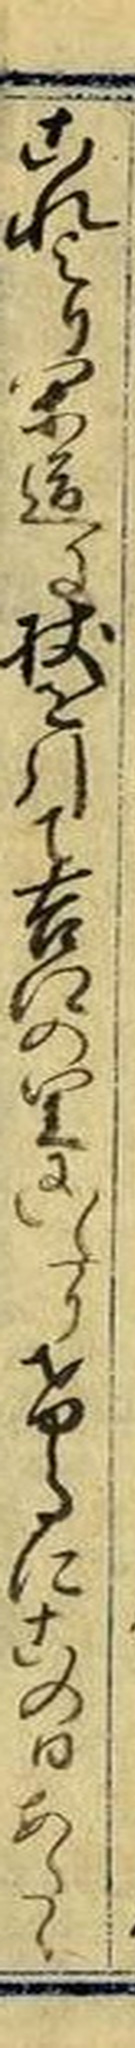これより閑道に杖を引て吉江の里にいたりけるにこの日あたゝ
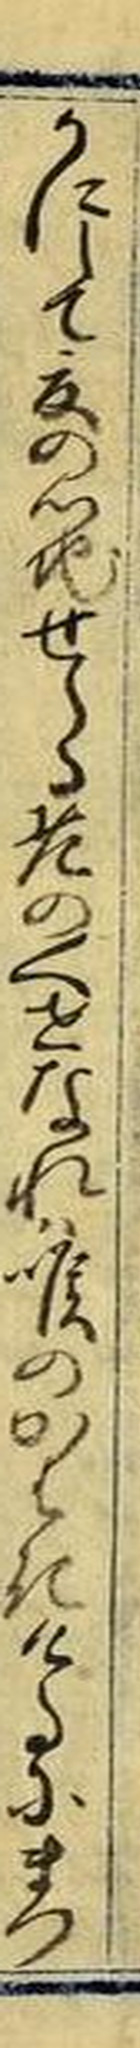かにして夏の心地せらる老のくせなれは喉のかはきけるにまつ
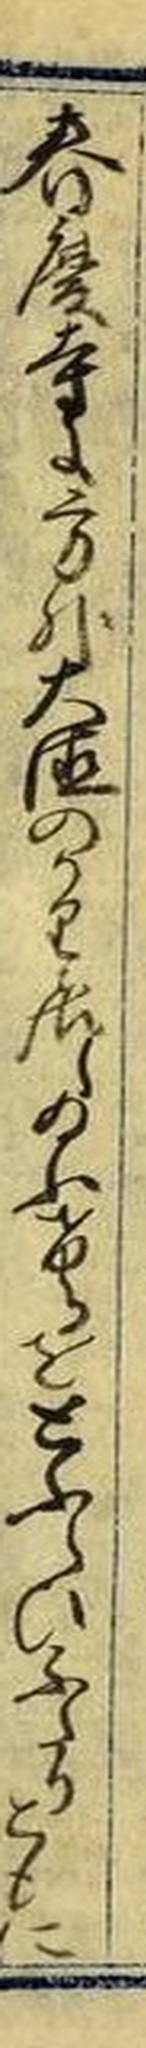春慶寺に方外大徳のかり居し給ふけるをとふらひふたりともに
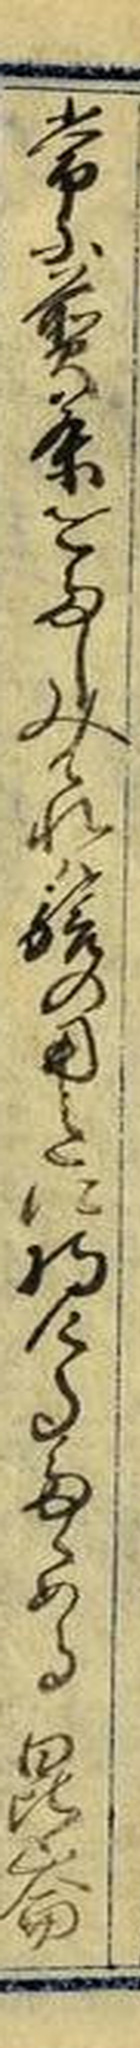常に煎茶をたしみけれは旅の用意に持けるたゝめる昆崙
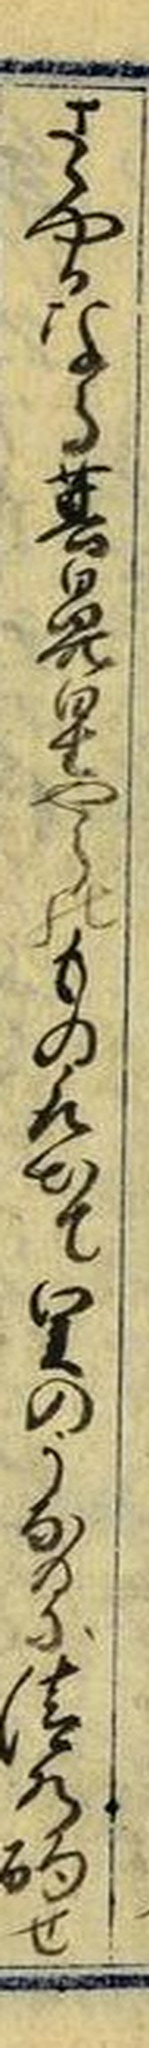さゝやかなる暮鼻星やらのもの取出て里のうなゐに清水酌せ
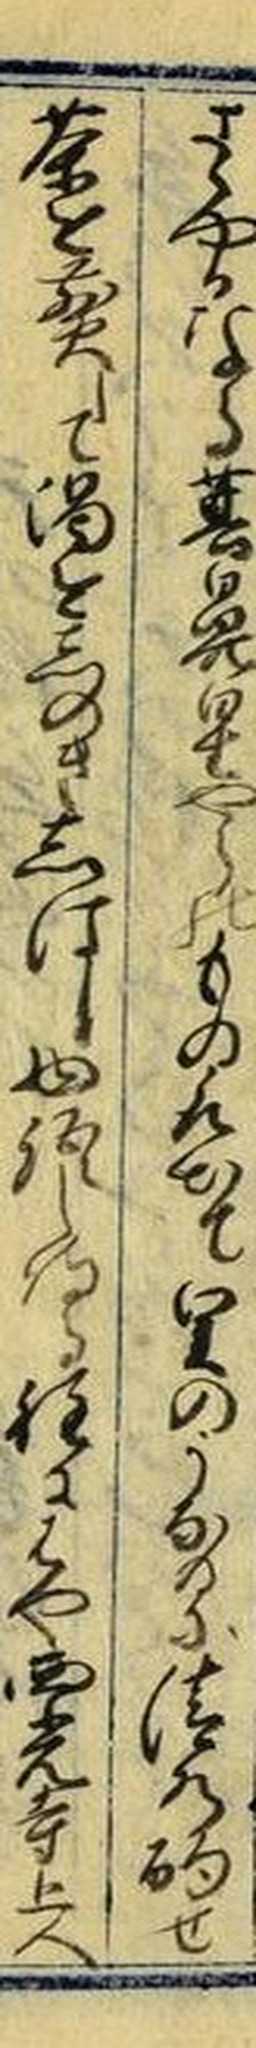茶を煎して渇をしのきしはし物語し侍る程にはや西光寺上人
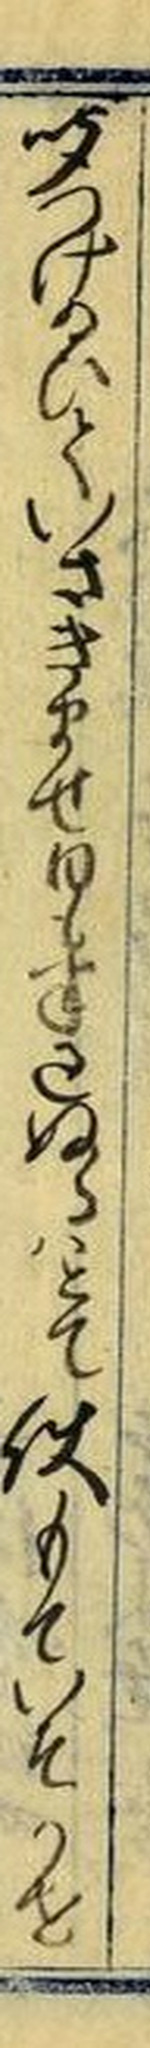聞つけ給ひていさきませ日も半過ぬるはとて使もていそかせ
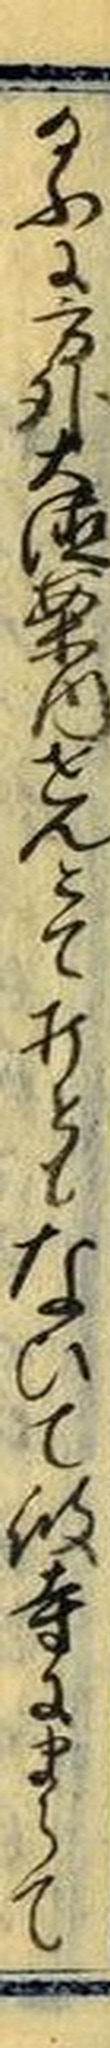給ふに方外大徳案内せんとて打ともなひて彼寺にまうて
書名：温古集 三巻
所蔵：福井県文書館 Fukui Prefectural Archives
